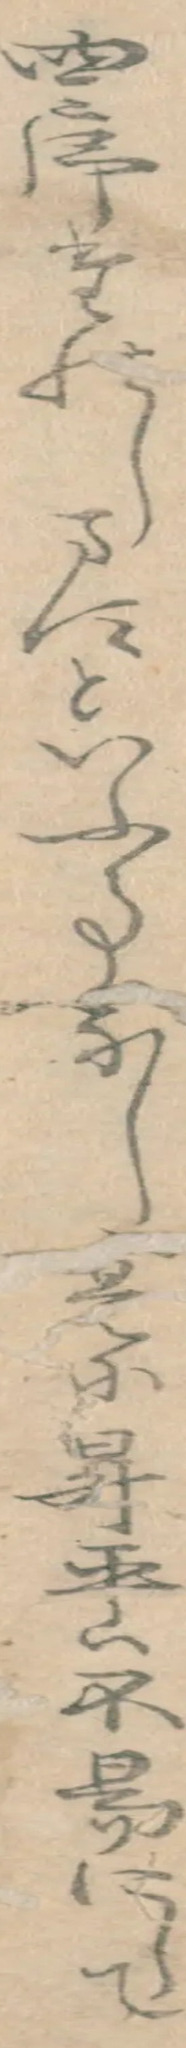四序たのしますといふ事なし寔に昇平は不易にして

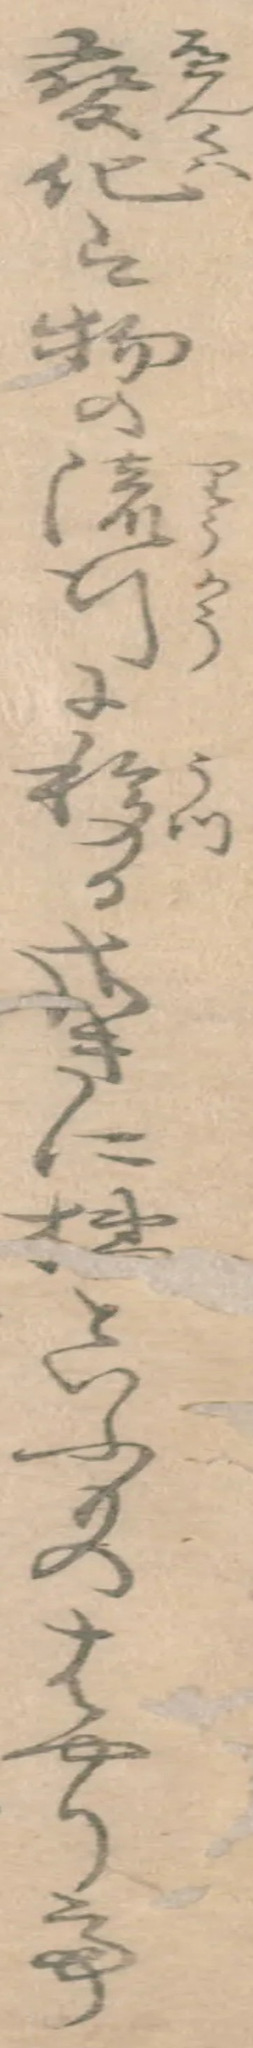変化は物の流行に移るさきに橘といふものはやりて
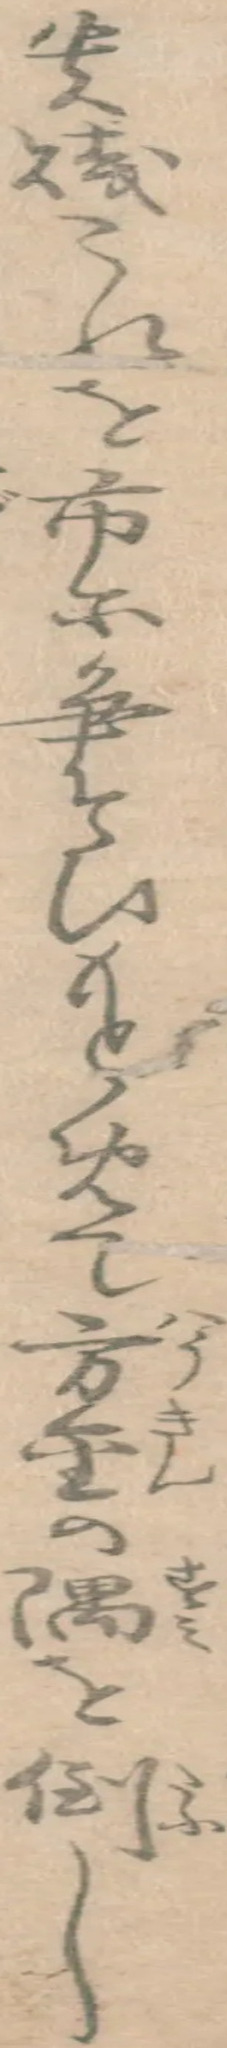貴賤これを市に争そひもとめて方金の隅を倒し
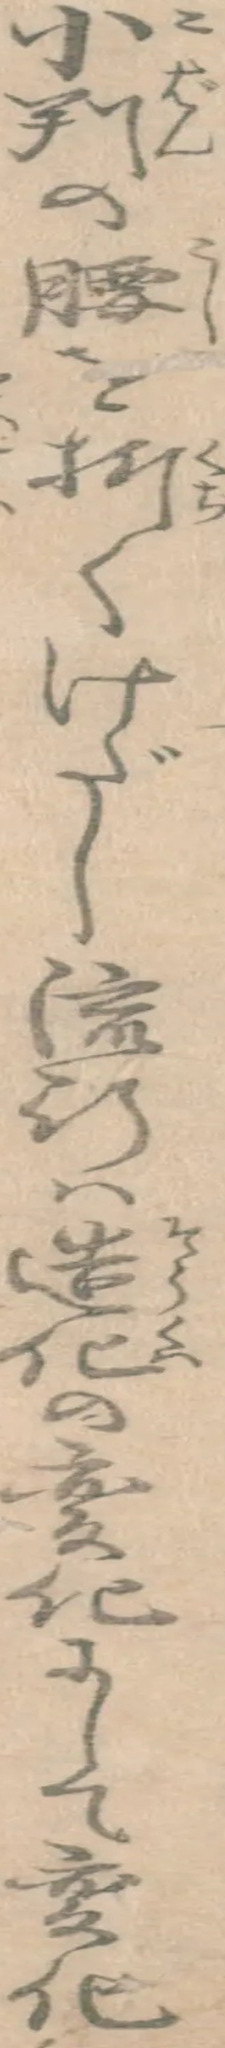小判の腰を折くけだし流行は造化の変化にして変化
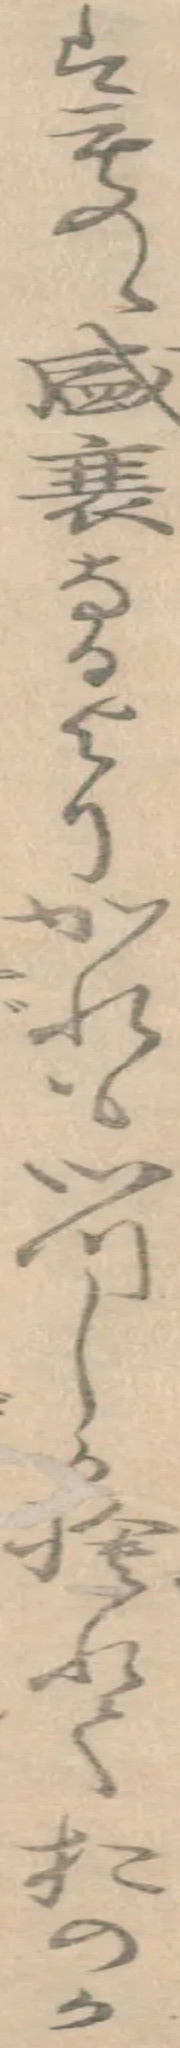はものゝ盛衰なるよりかれもいつしか捨れておのか
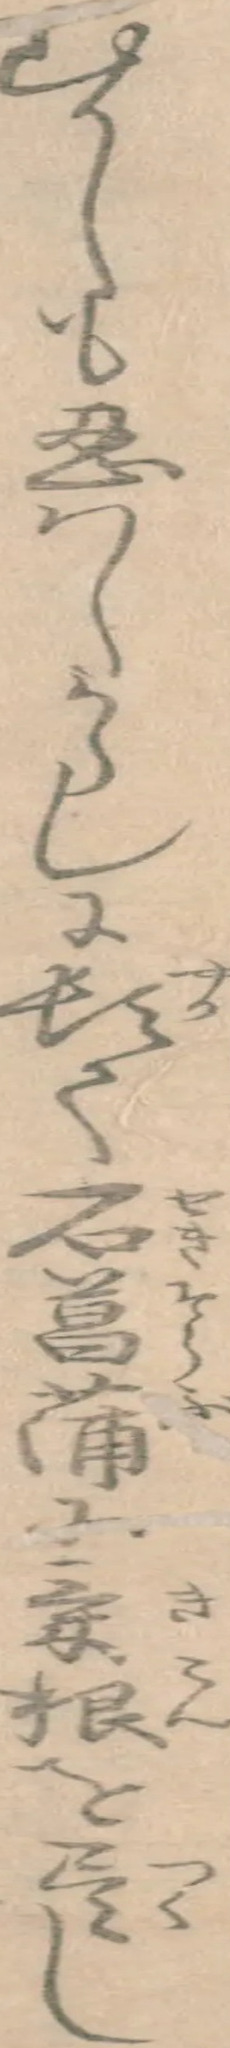むかしも忍はしからしに頓て石菖蒲に気根を尽し
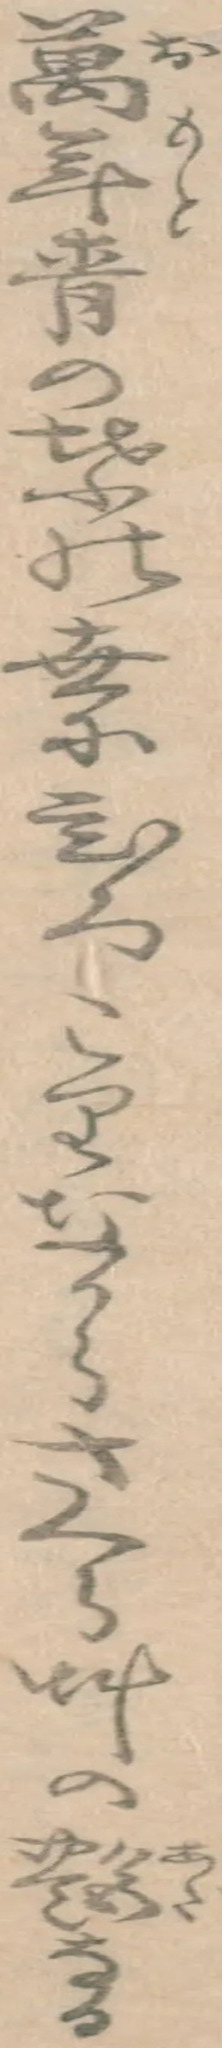万年青の葉の世にひろこりなからさくら草の艶なる
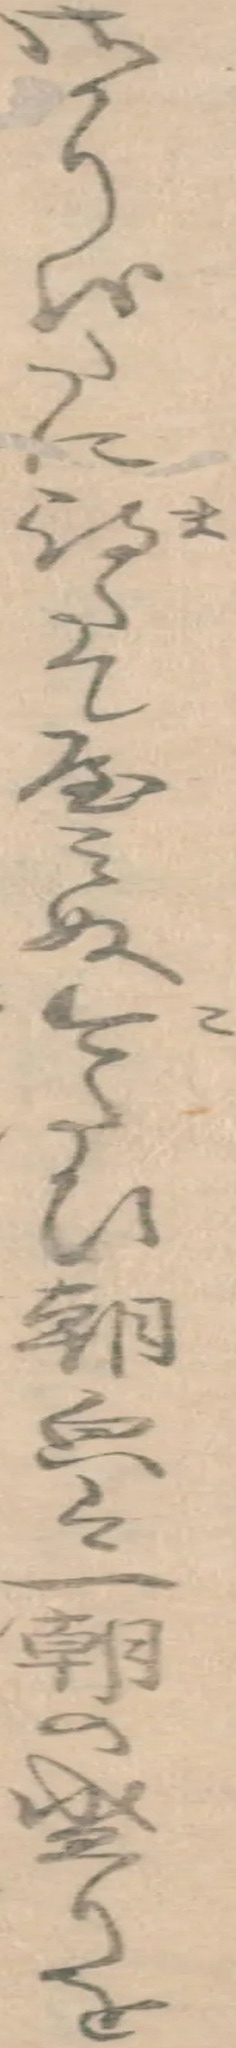さかりをたに待たてやみぬ今たひ朝皃は一朝の盛りを
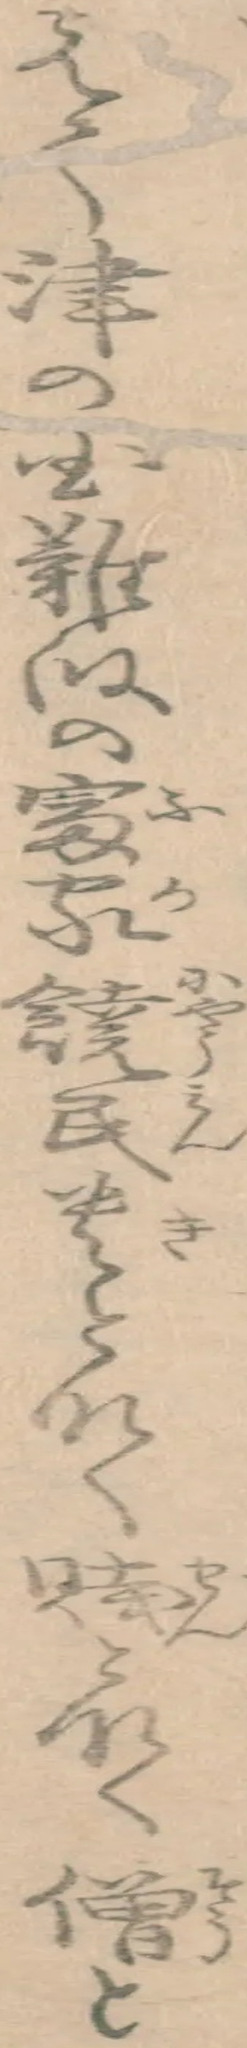えて津の国難波の富家饒民貴となく賤となく僧と
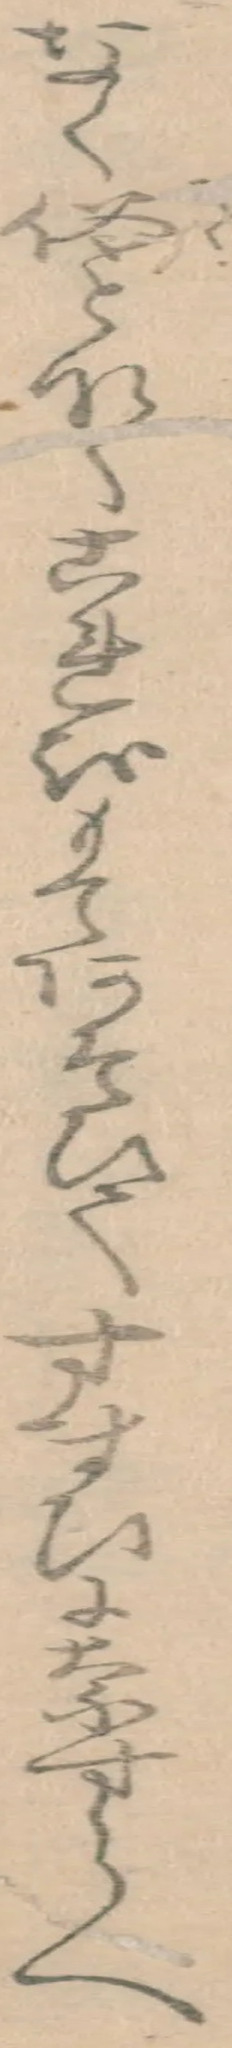なく俗となくこれをもてあそひてすまひになすらへ
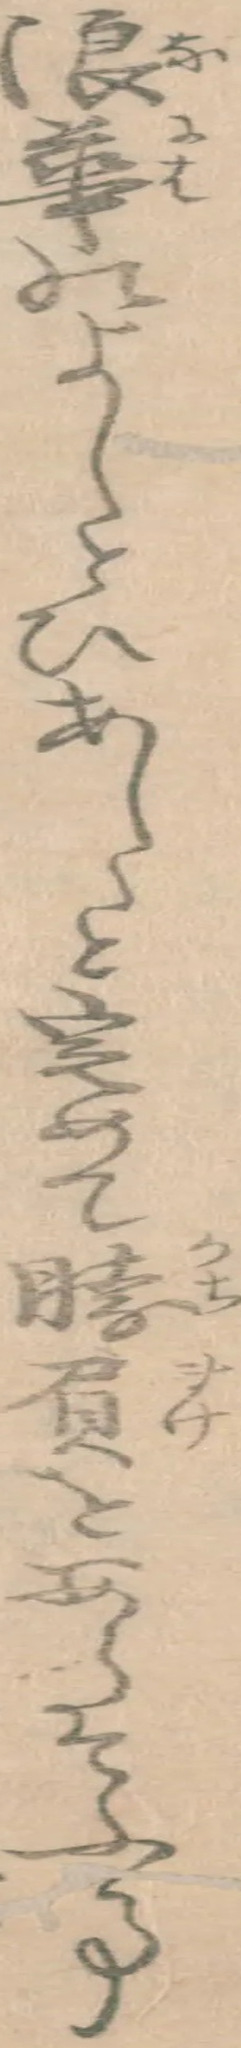浪華のよしとひあしゝと定めて勝負をあらそふ事
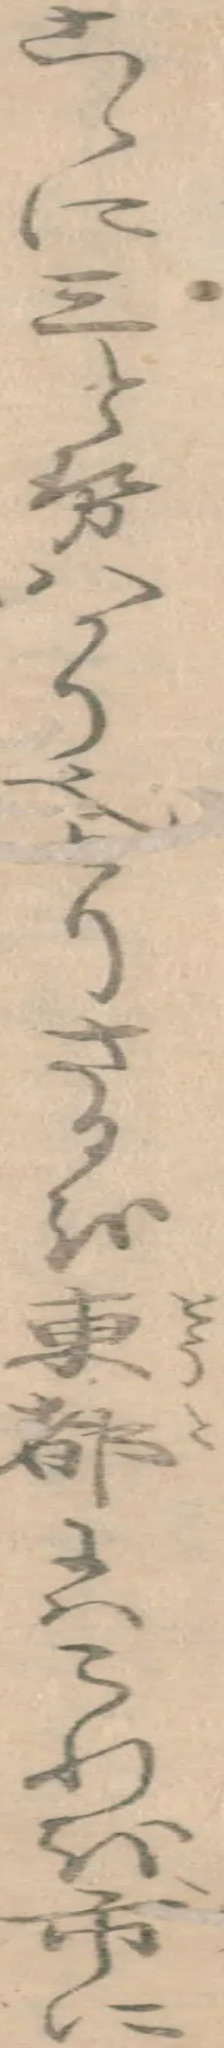こゝに三とせはかり也けりさるを東都にはこれを市に
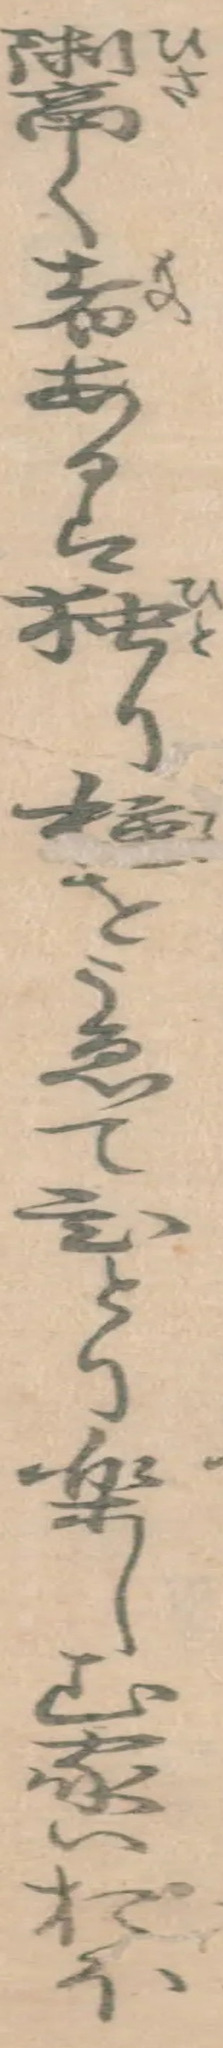鬻く者あるは独り種をうゑてひとり楽しむ家はおほ
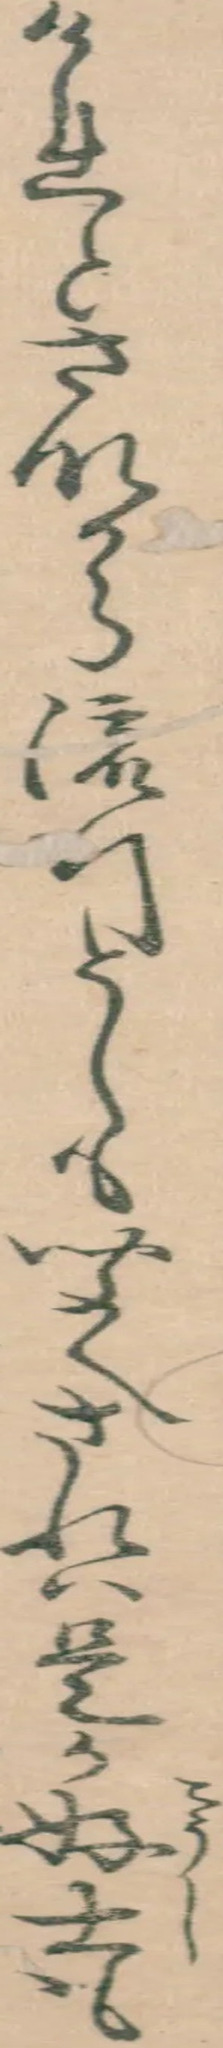けれとさなから流行としも聞へされは是か好士も
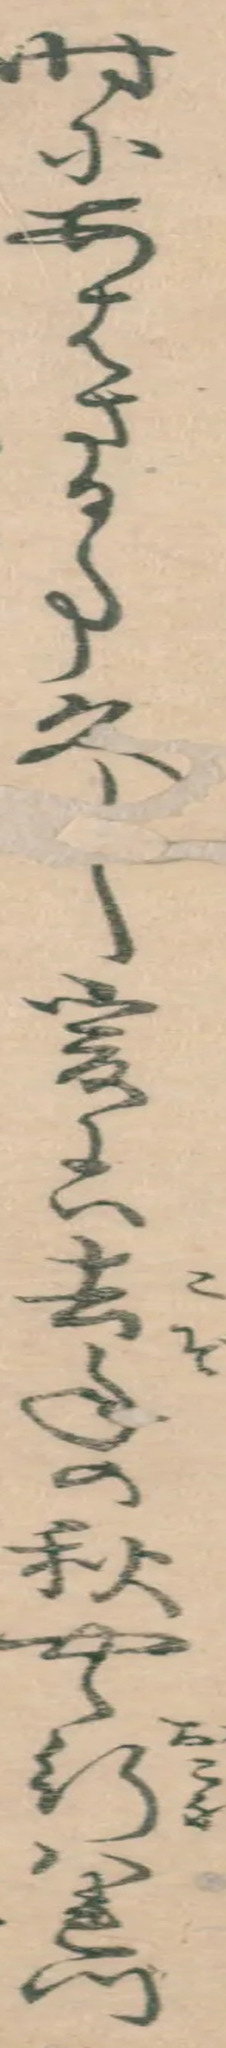時にあはさる事久し爰には去年の秋やゝ行はれつ
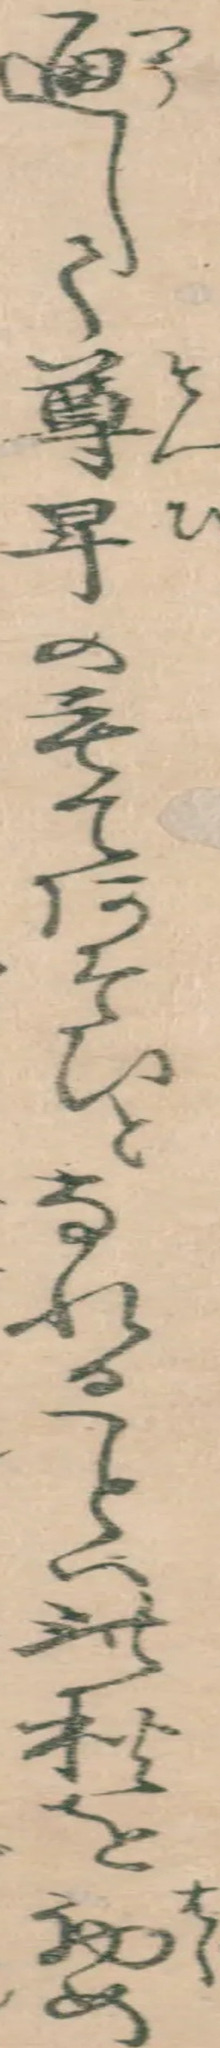通して尊卑のもてあそひとなれることは此秋を初め
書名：朝顔叢. 上巻
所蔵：国立国会図書館 National Diet Library, JAPAN
